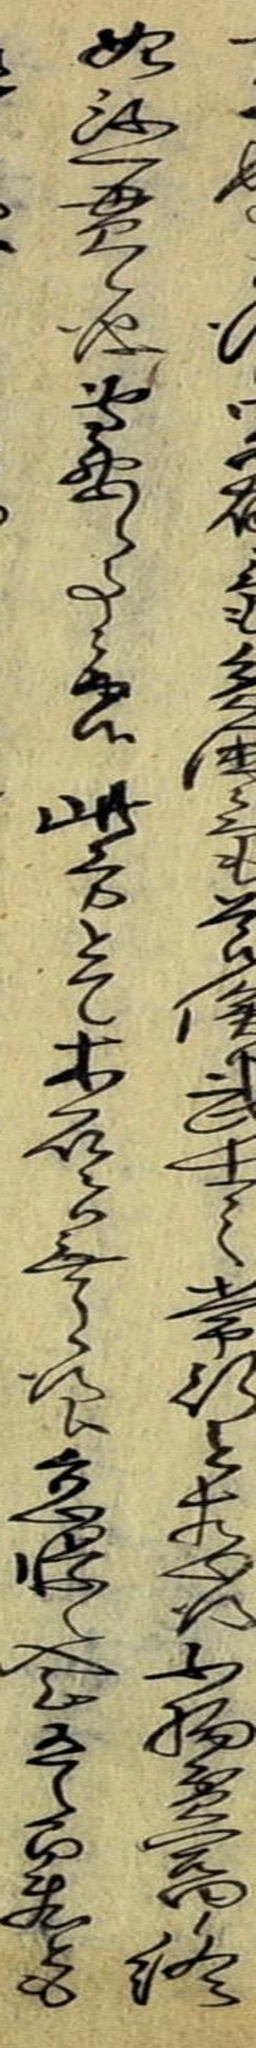始致一貫候儀専要之事に而候此方とて木石には無之候得は怠慢之念有之間敷とも
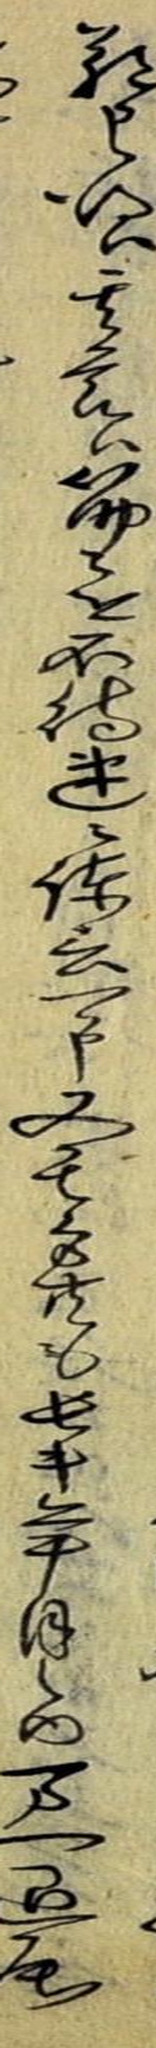難申候得は其節は筋々を不待速に体言可申又其方共も長キ年月之内万一追尾
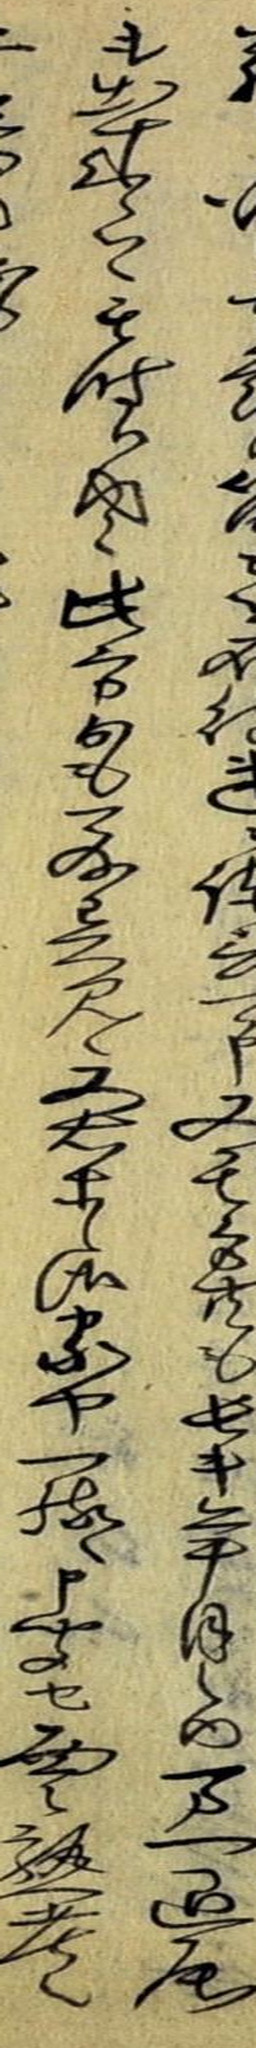も出来候はヽ其時は内々此方ゟも可及異見候又右等之趣家中一統へ申聞セ面々塾考之
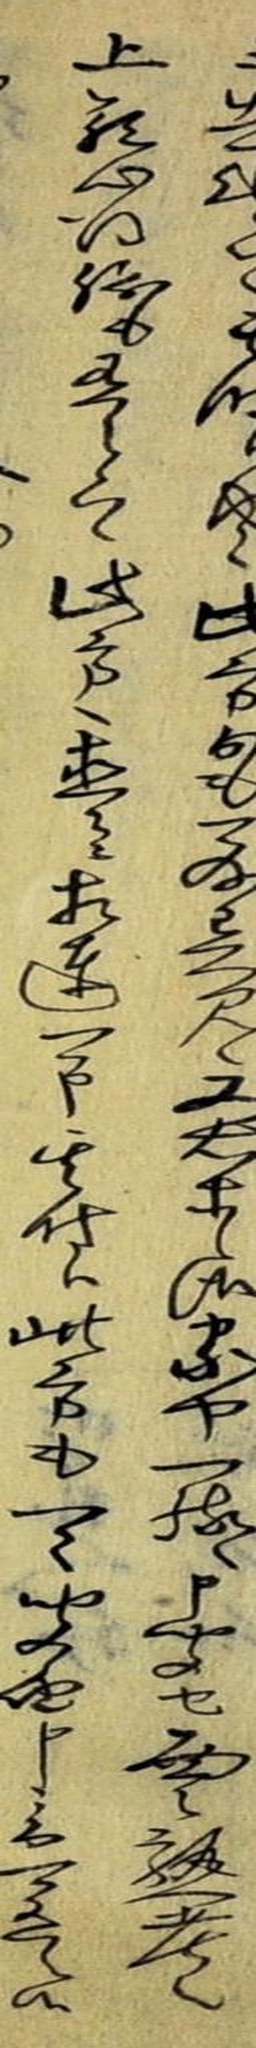上難心得儀も有之候はヽ此方へ直々に相達可申其時は此方も可被聞届申に而可有之候
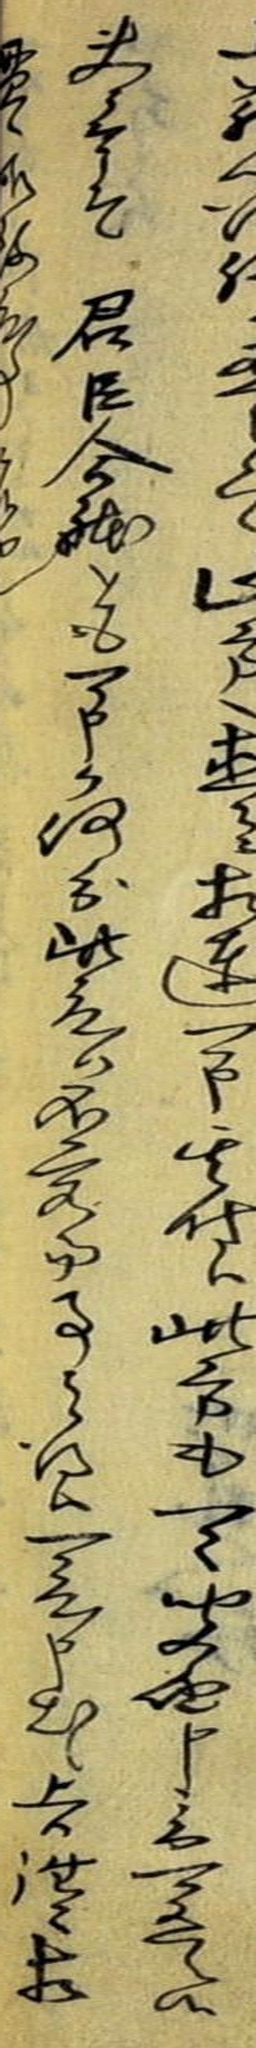夫々今迄君臣合体とも可申か何分此度は不容易事に候得は一言申出候上は往々相
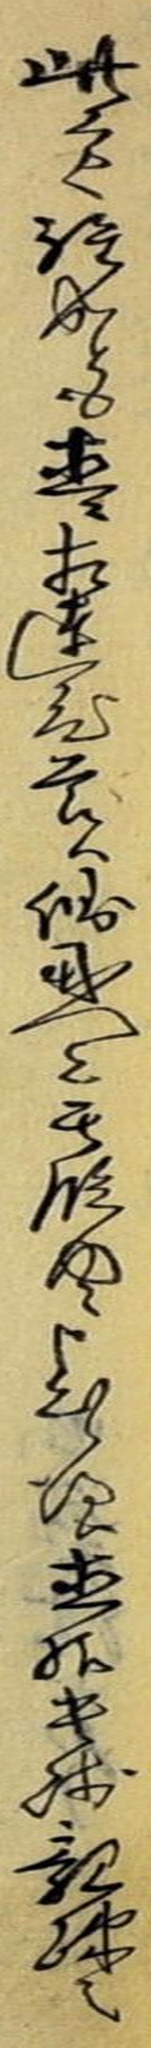此方へ誰成とも直々相達度節は側用人迄其段内々申出候得は直様貴賤親疎之
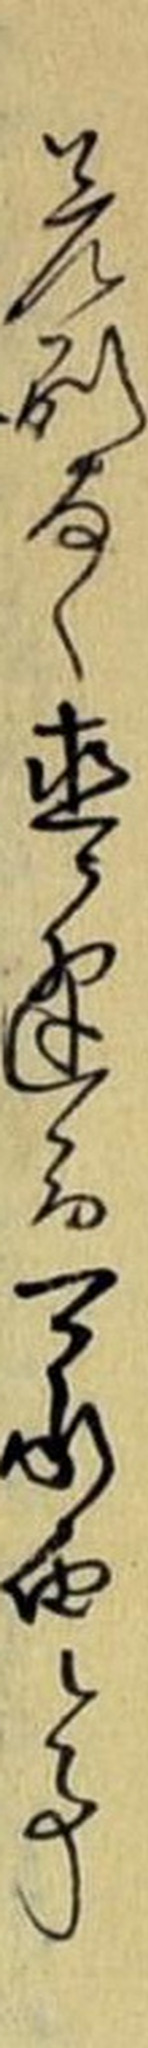差別なく直々逢而可承届候事
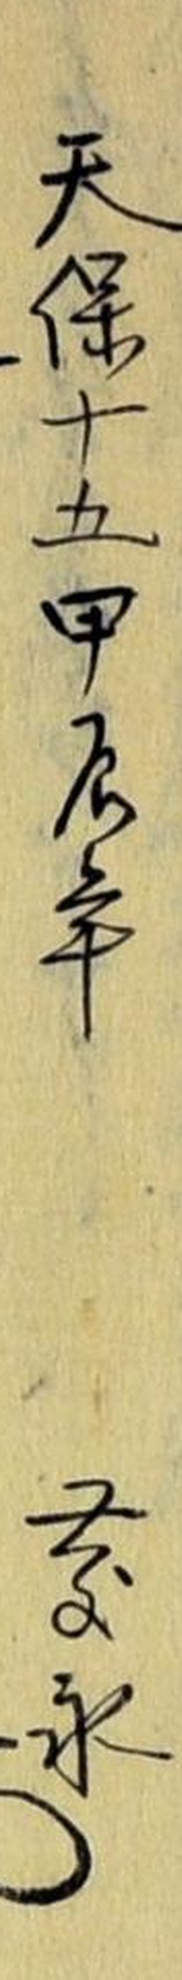天保十五甲辰年慶永
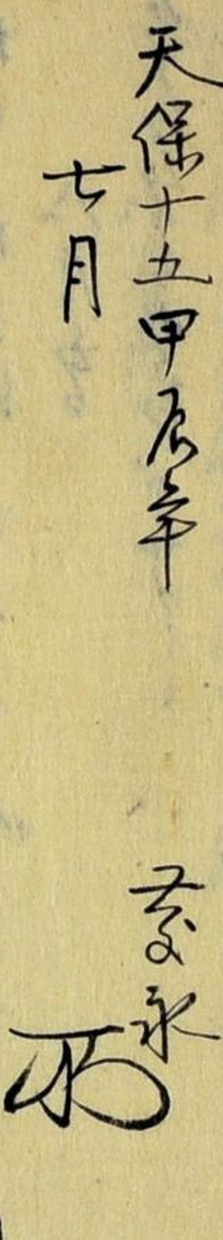天保十五甲辰年慶永
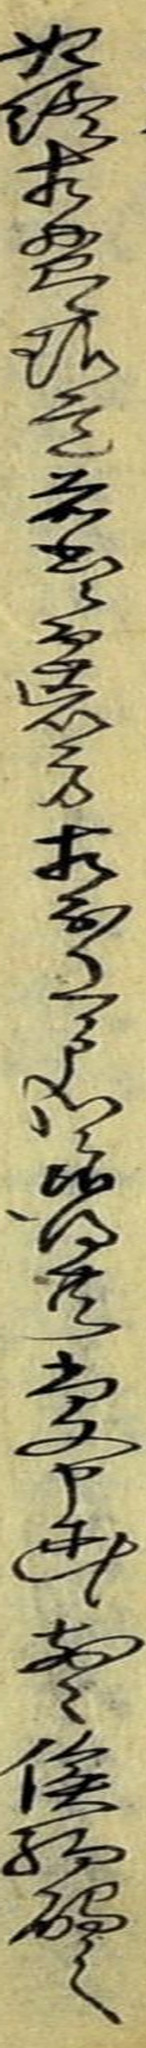始終相貫候趣意前書に而荒方相分り可申哉に候得共尚又申通候前々倹約触之
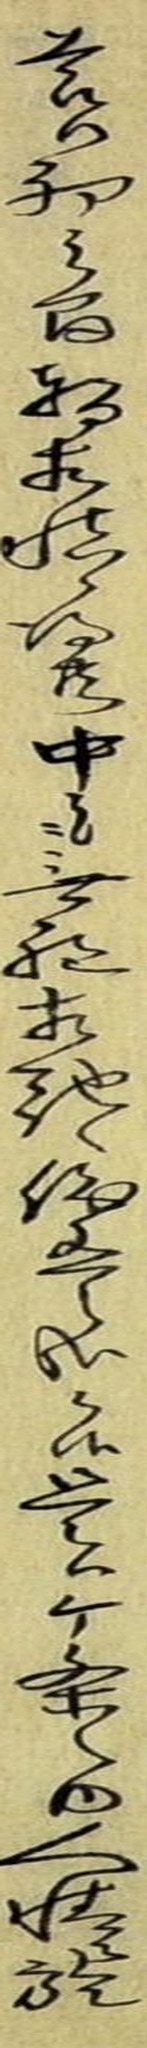節は初之間朝相慎候得共中にも無程相弛候儀有之哉に候是はヶ条之内人情に於
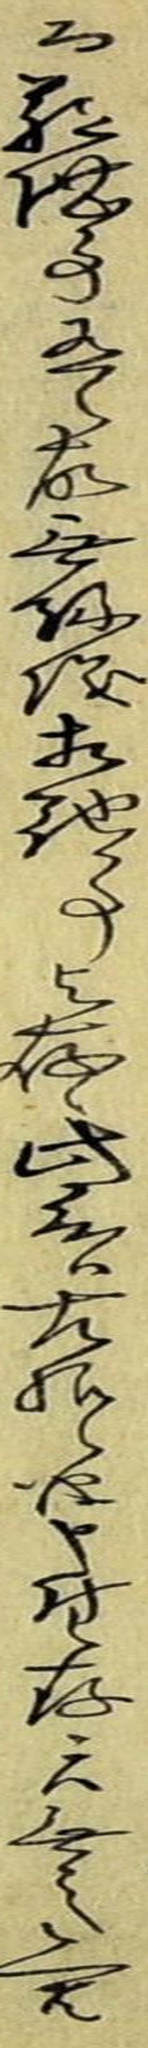而難渋事有之故無余儀相弛事と存候此度は左様之儀申付候存には無之候へ共
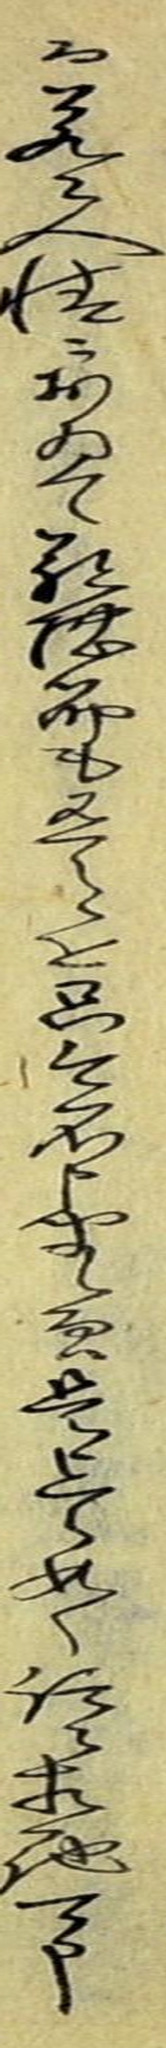而若今人情におゐて難渋筋も有之候を思召不申聞候而は是迄之如く跡々相弛可申
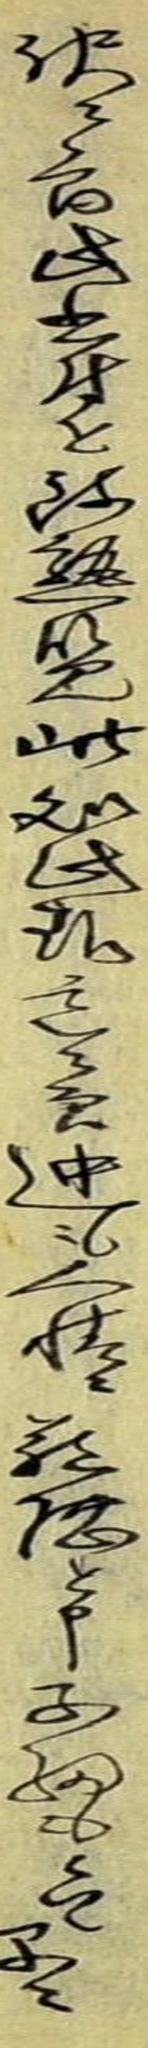訳に候間此書付を致熟覧此処此趣意に而は迚も人情に難渋と申子細も候はヽ早々
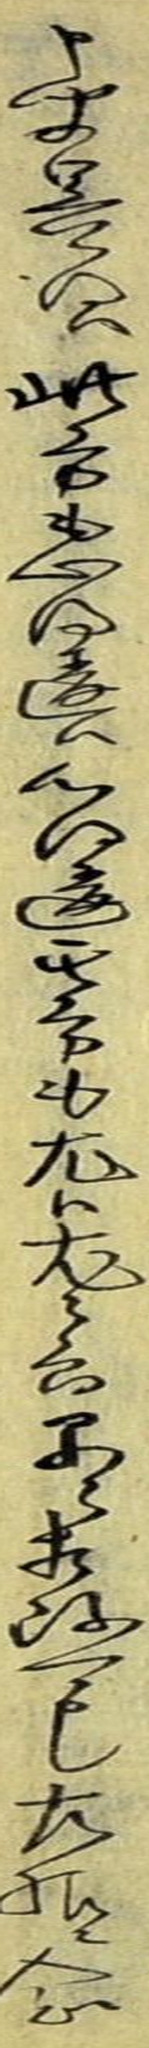申聞呉候得は此方も心得違は心得違其方も尤は尤に候間早々相改可申候左様に念
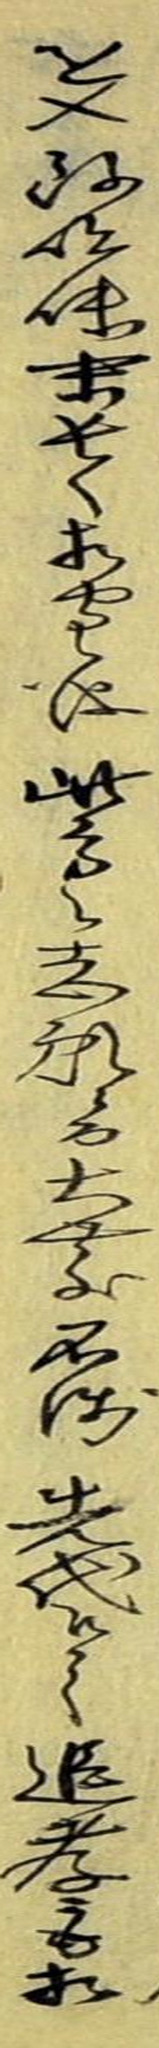を入致吟味末長く相守候儀此方之志願に而大慶不残先代江之追孝にも
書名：命令之部 六
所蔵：福井県文書館 Fukui Prefectural Archives
